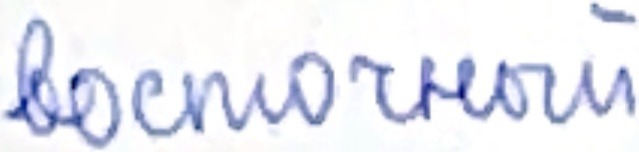восточный
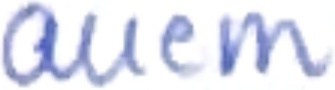аист
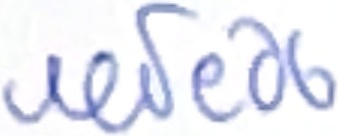лебедь
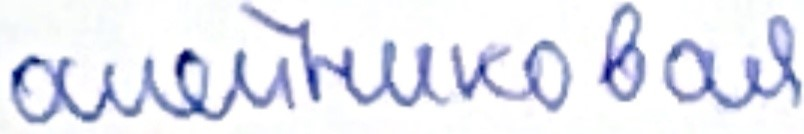алейниковая
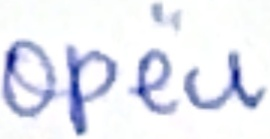орёл
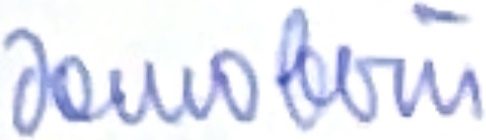домовый
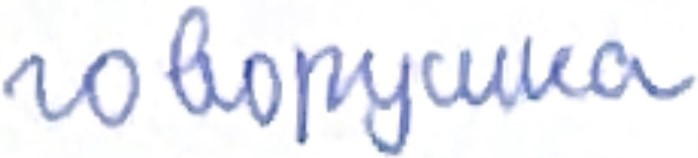говорушка
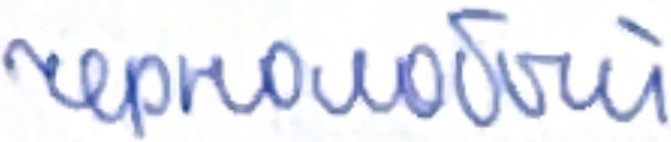чернолобый
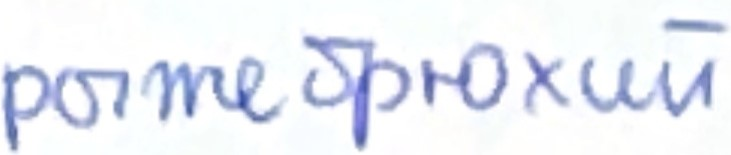рыжебрюхий
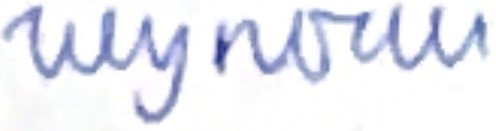глупыш
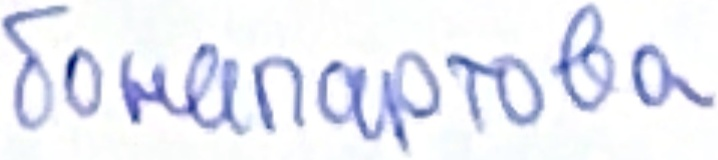бонапартова
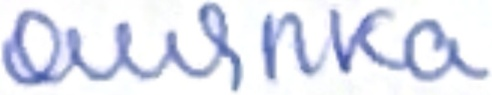оляпка
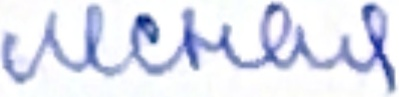лесная
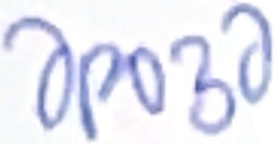дрозд
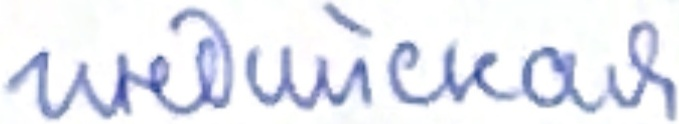индийская
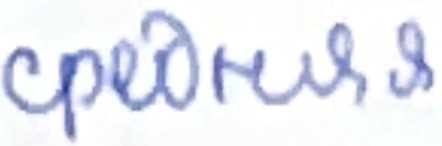средняя
